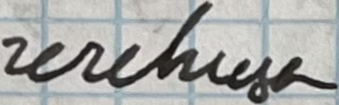чечевица
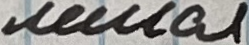лесная
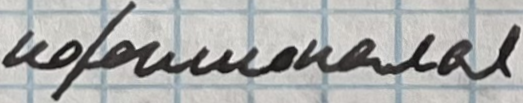короткопалая
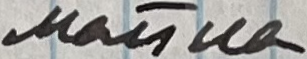майна
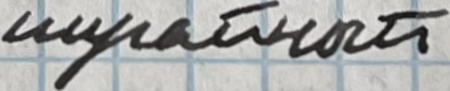тугайный
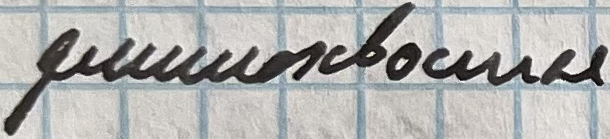длиннохвостая
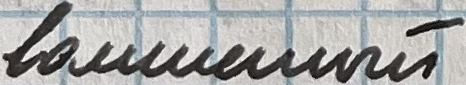волнистый
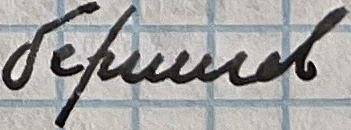берингов
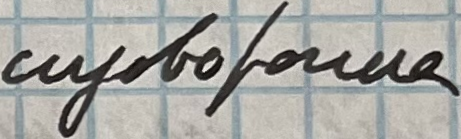сизоворонка
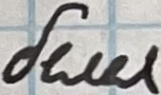белая
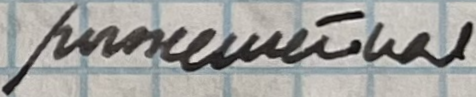рыжешейная
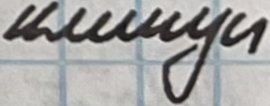кликун
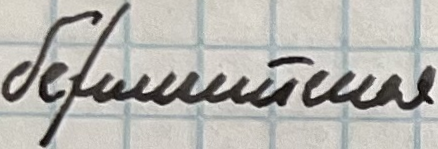берингийская
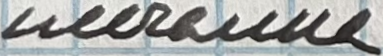песчанка
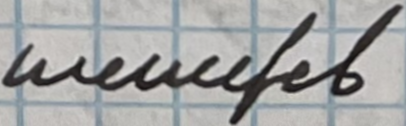тетерев
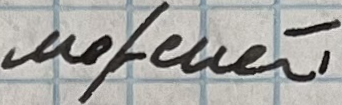морской
